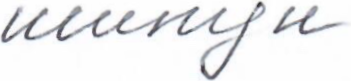шипун
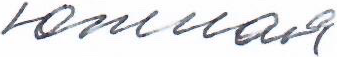южная
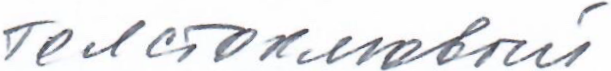толстоклювый
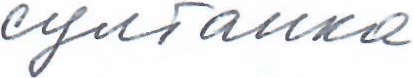султанка
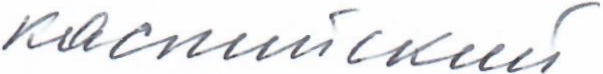каспийский
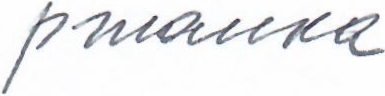ржанка
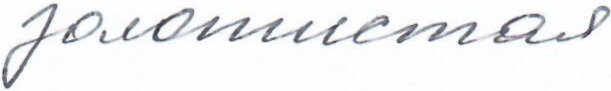золотистая
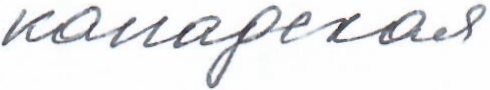канадская
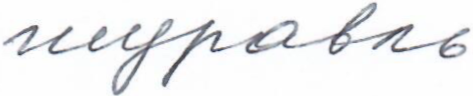журавль
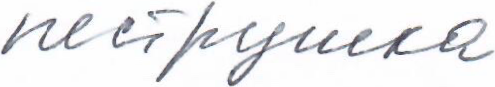пеструшка
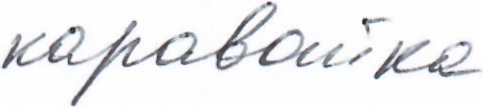каравайка
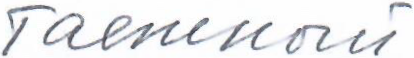таежный
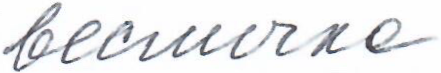весничка
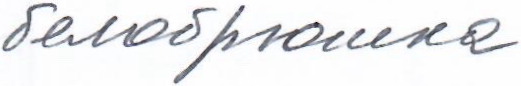белобрюшка
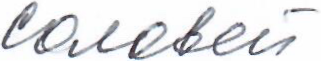соловей
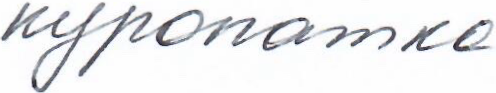куропатка
